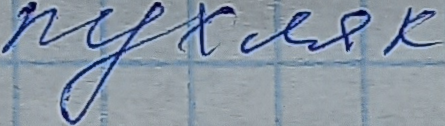пухляк
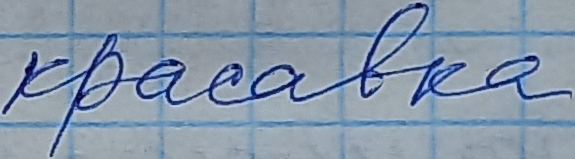красавка
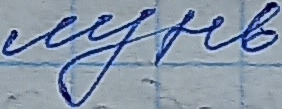лунь
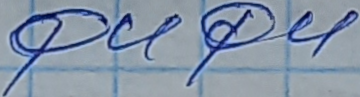фифи
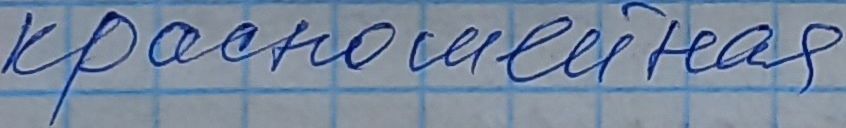красношейная
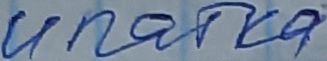ипатка
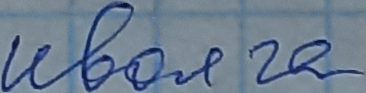иволга
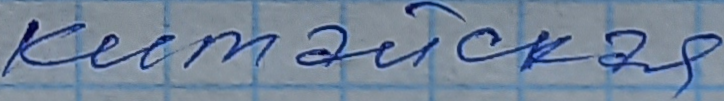китайская
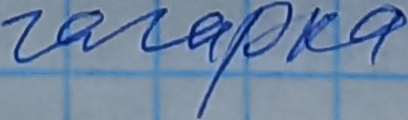гагарка
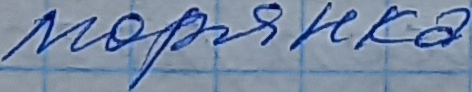морянка
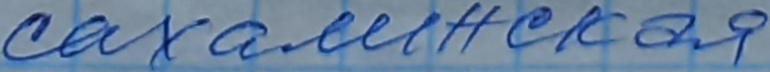сахалинская
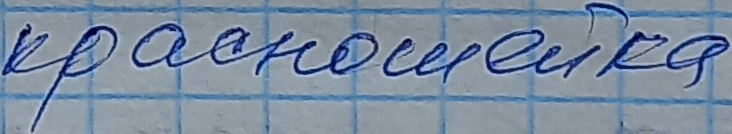красношейка
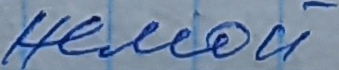немой
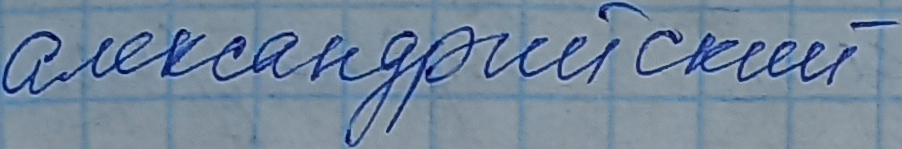александрийский
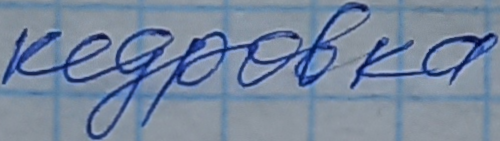кедровка
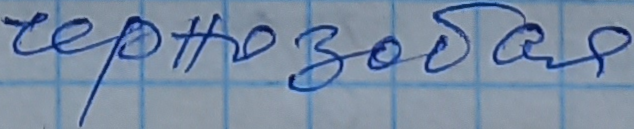чернозобая
